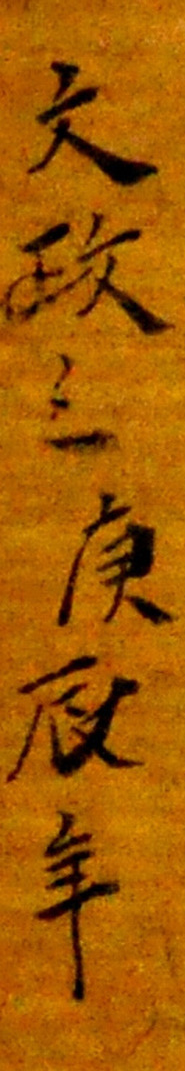文政三庚辰年
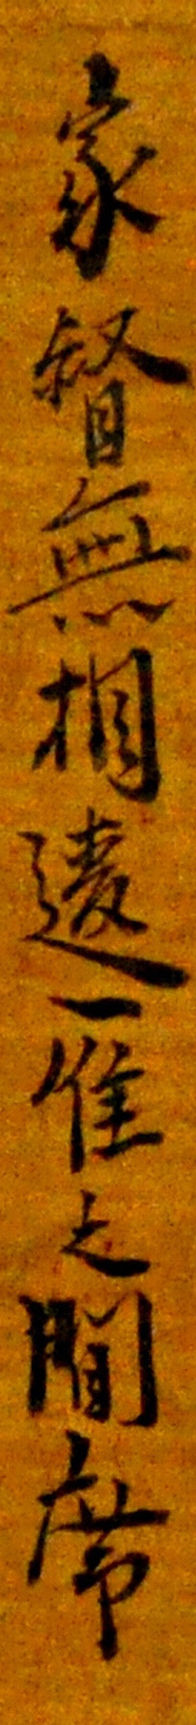家督無相違雁之間席
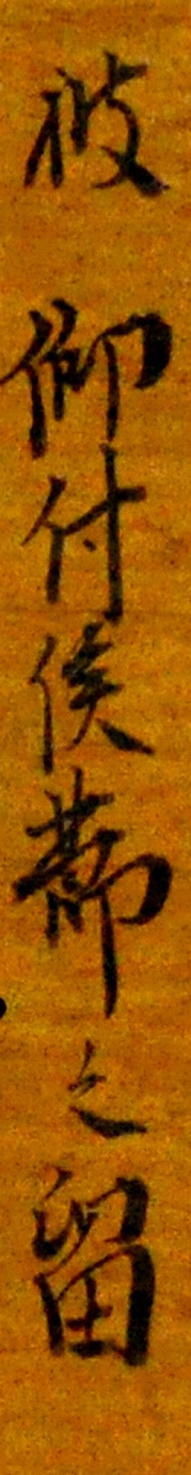被仰付候節之留
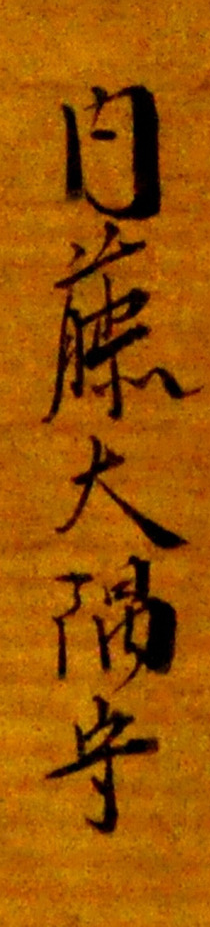内藤大隅守
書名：内藤頼寧公家督ノ節ノ留書外
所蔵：伊那市立高遠町図書館・合同会社AMANE
